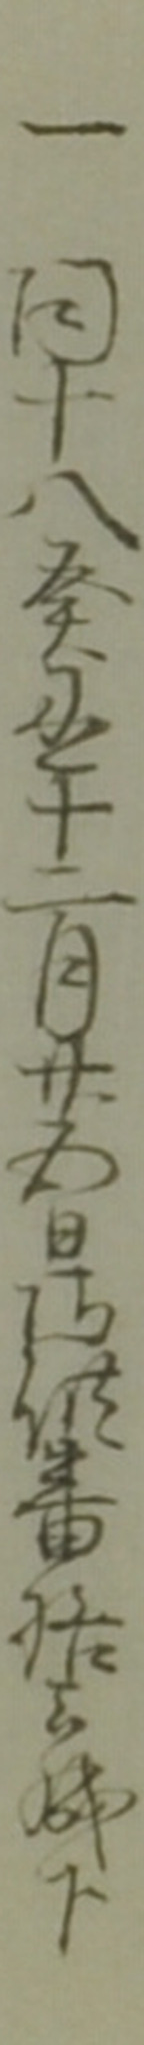一同十八癸丑十二月廿五日御供番格被成下
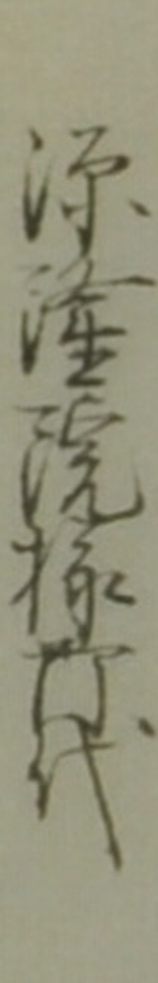源隆院様御代
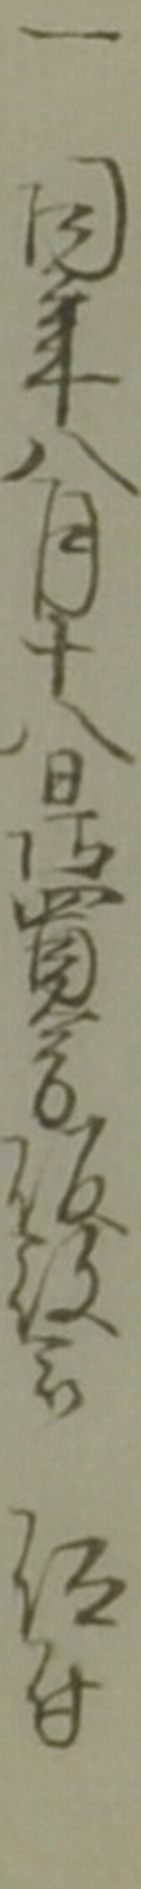一同年八月十八日御買方仮役被仰付
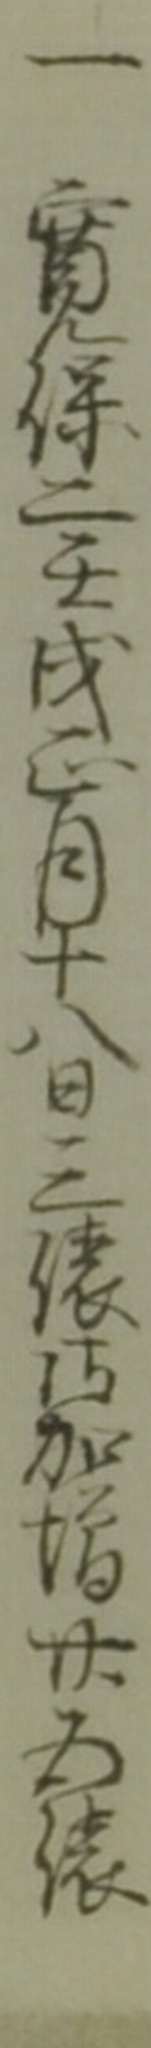一寛保二壬戌正月十八日三俵御加増廿五俵
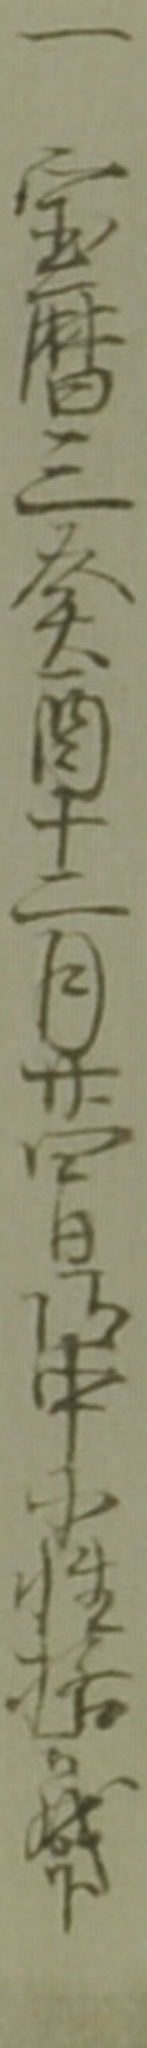一宝暦三癸酉十二月廿四日御中小性格被成下
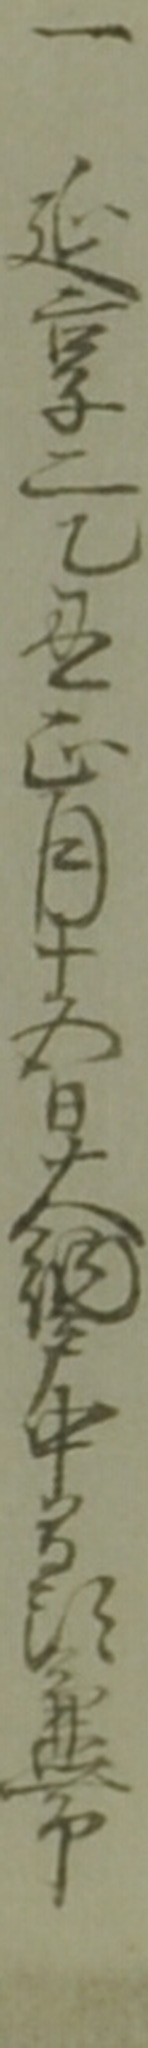一延享二乙丑正月十五日大納戸中間頭兼帯
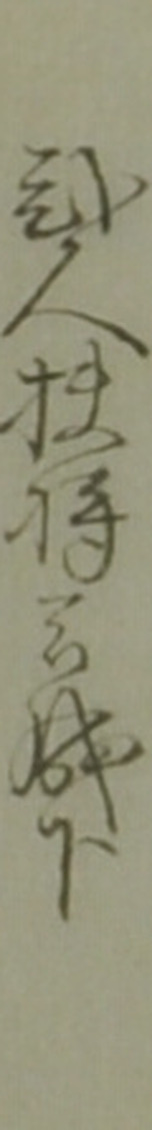弐人扶持被成下
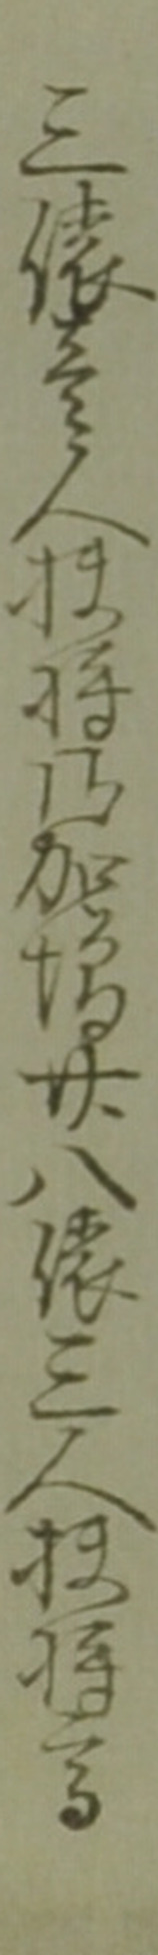三俵壱人扶持御加増廿八俵三人扶持高

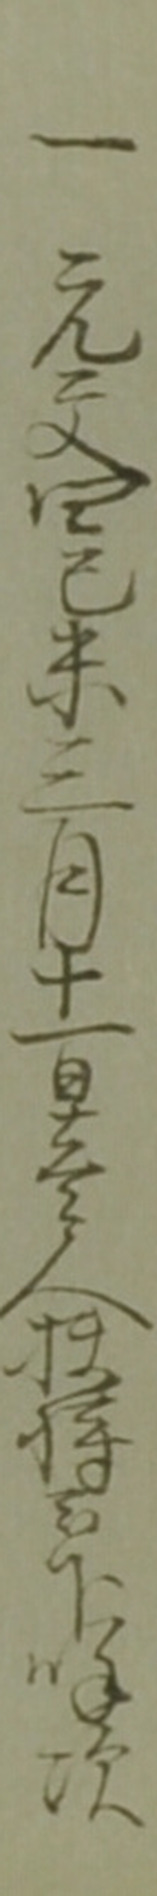一元文四己未三月十一月壱人扶持被下呼次
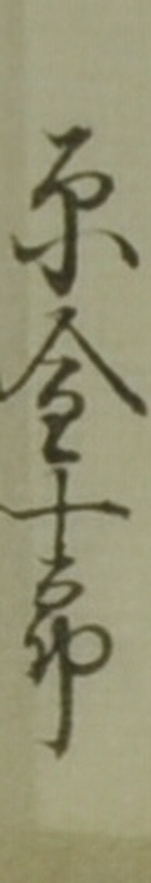原金十郎
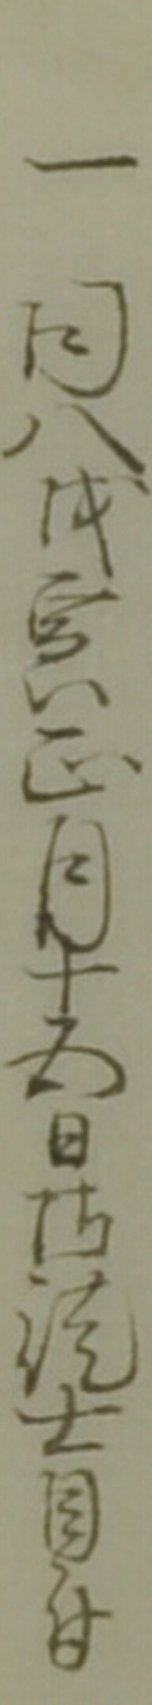一同八戊寅正月十五日御徒士目付
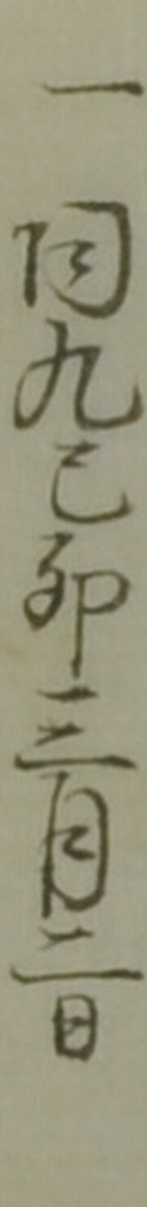一同九己卯三月二日
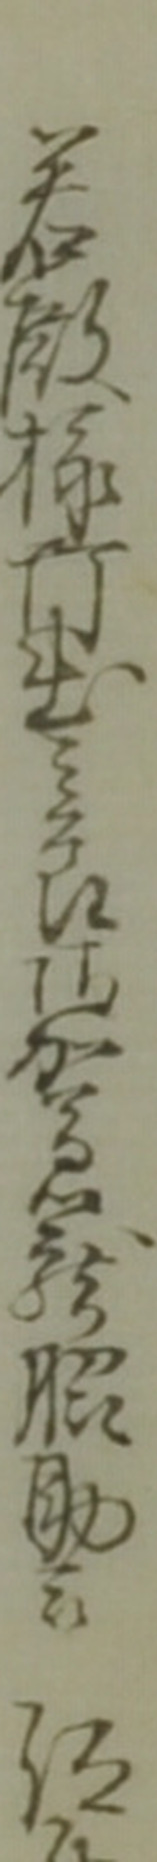若殿様御出之節御駕籠脇助被仰付
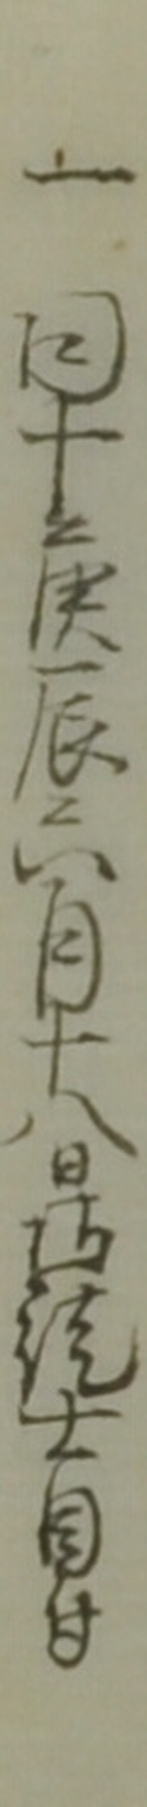一同十庚辰六月十八日御徒士目付
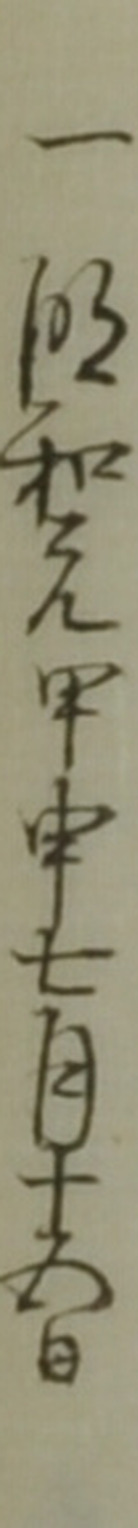一明和元甲申七月十五日
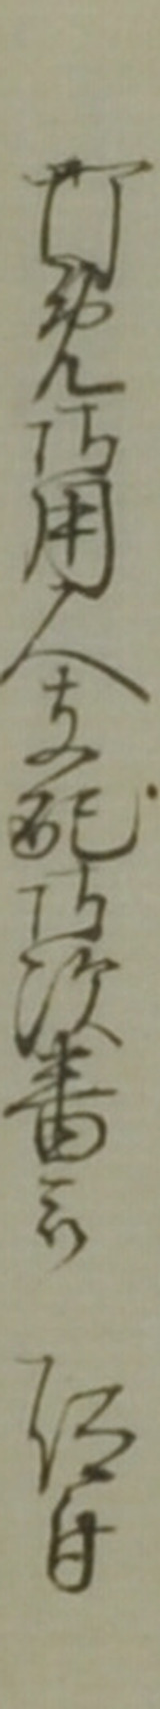御免御用人支配御次番被仰付
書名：無足諸士勤仕録（一）
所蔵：伊那市立高遠町図書館・合同会社AMANE
